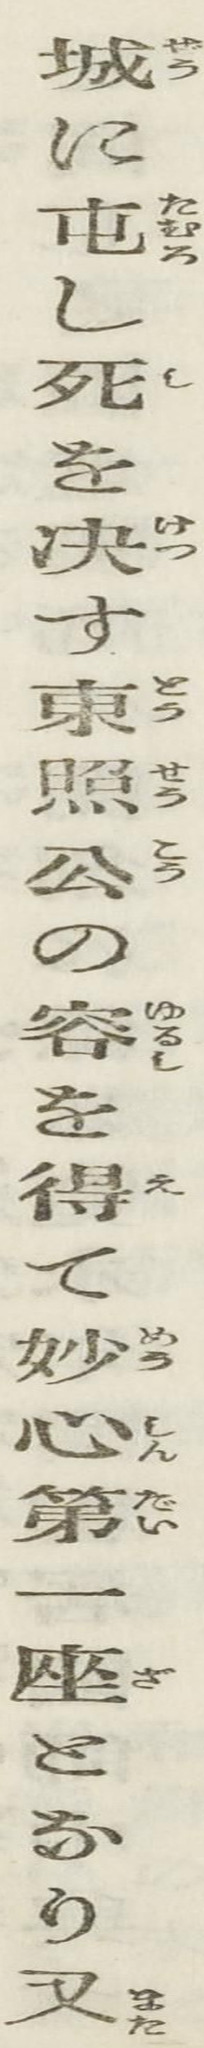城に屯し死を決す東照公の容を得て妙心第一座となり又
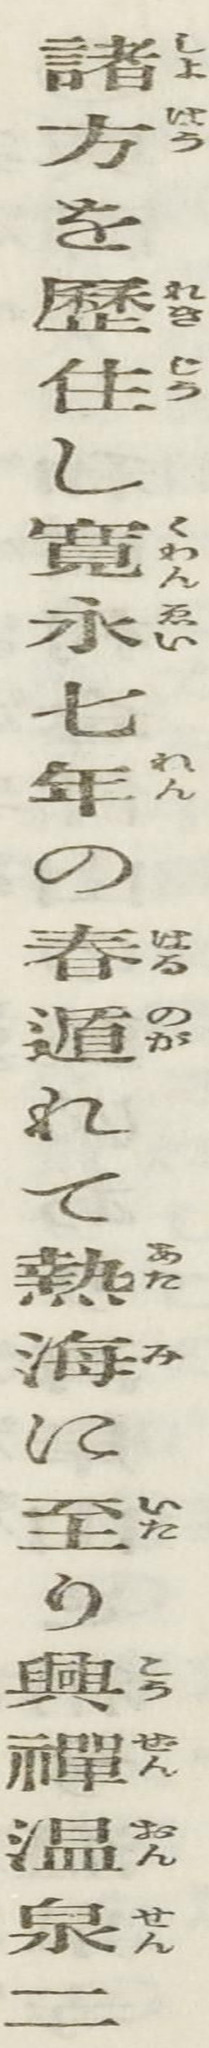諸方を歴住し寛永七年の春遁れて熱海に至り興禪温泉二
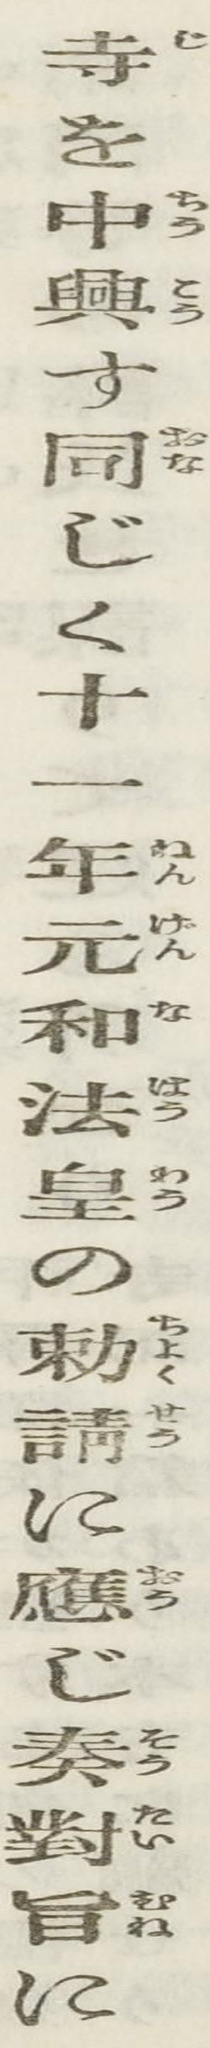寺を中興す同じく十一年元和法皇の勅請に応じ奏対旨に
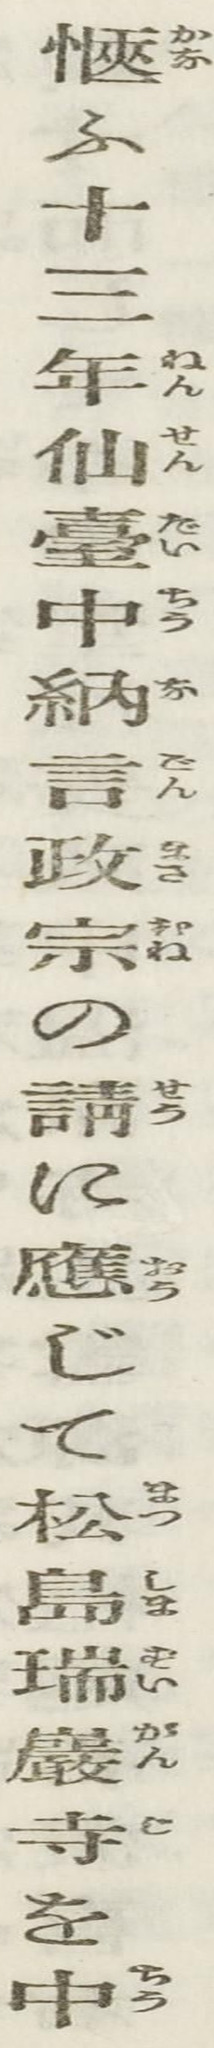愜ふ十三年仙臺中納言政宗の請に応じて松島瑞巌寺を中
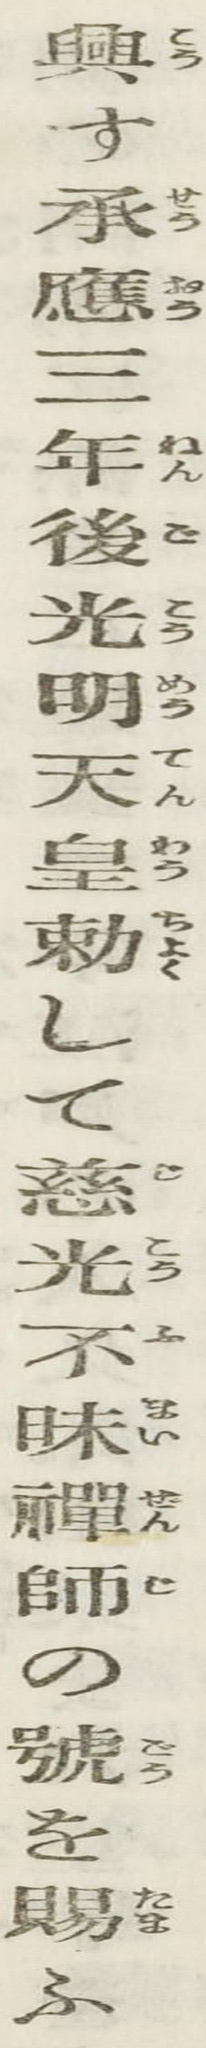興す承応三年後光明天皇勅して慈光不昧禅師の號を賜ふ
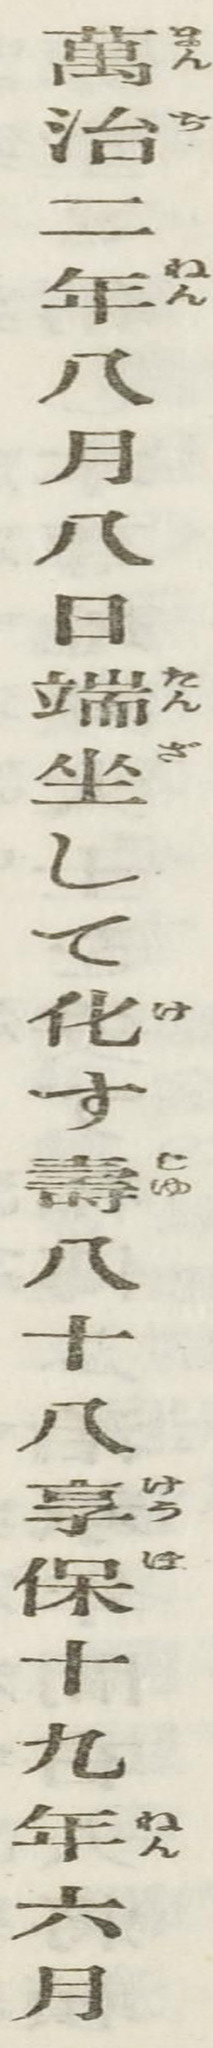萬治二年八月八日端坐して化す壽八十八享保十九年六月
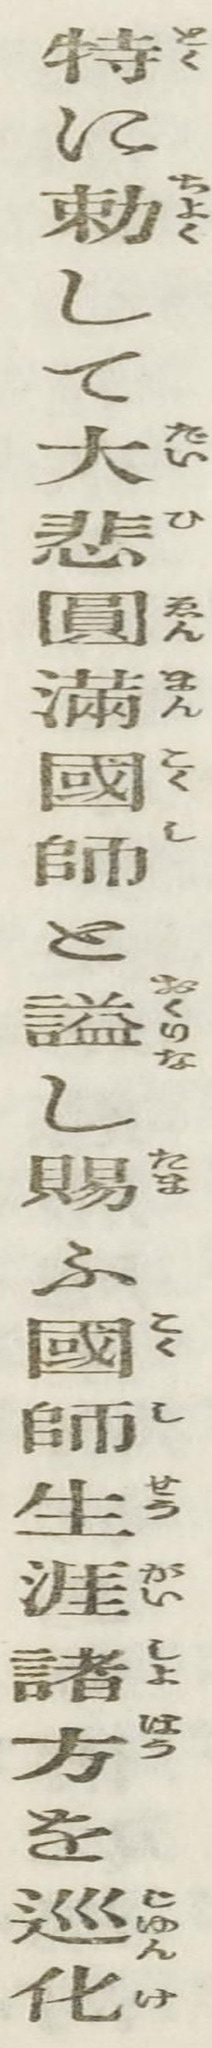時に勅して大悲圓満國師と謚し賜ふ國師生涯諸方を巡化
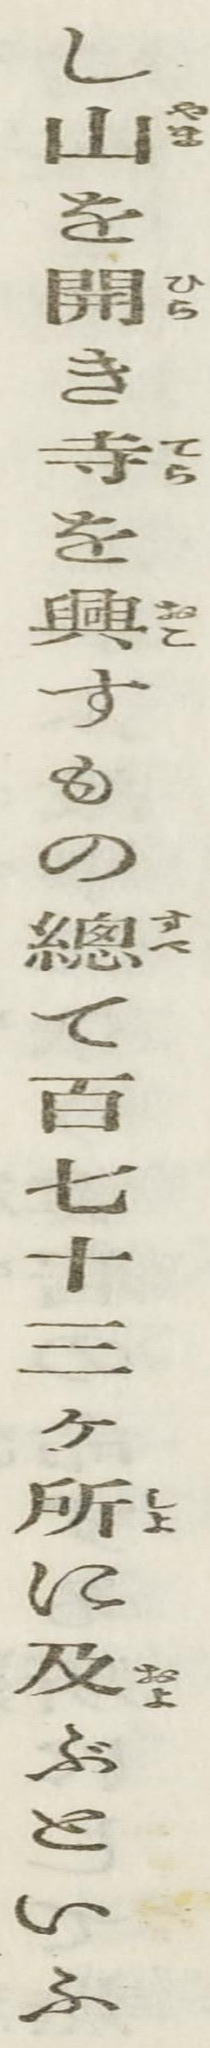し山を開き寺を興すもの総て百七十三ヶ所に及ぶといふ
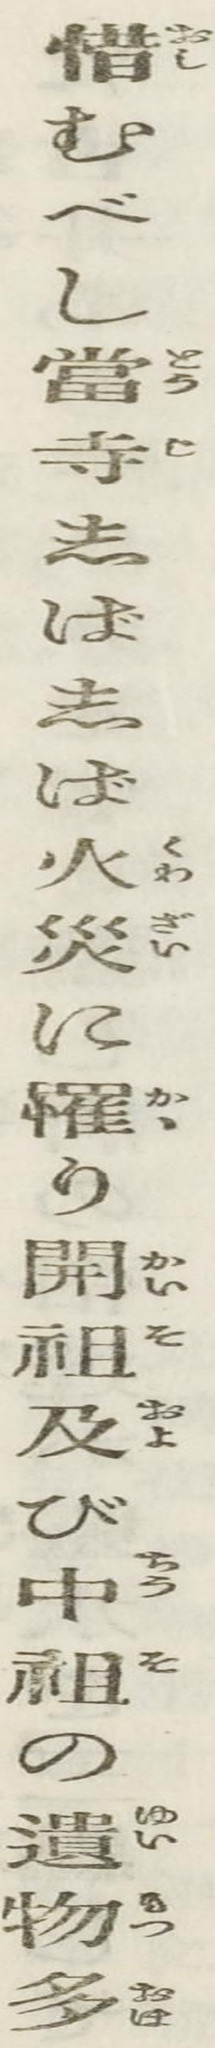惜むべし當寺しばしば火災に罹り開祖及び中祖の遺物多
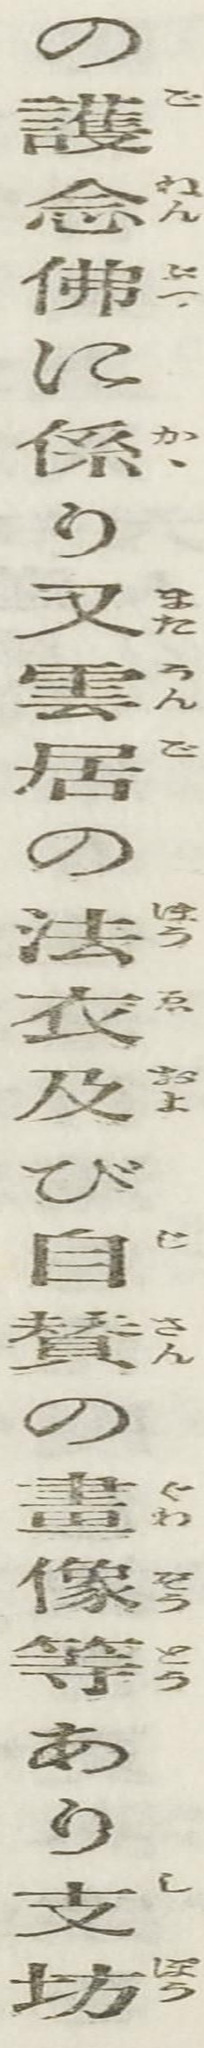の護念佛に係り又雲居の法衣及び自賛の畫像等あり支坊
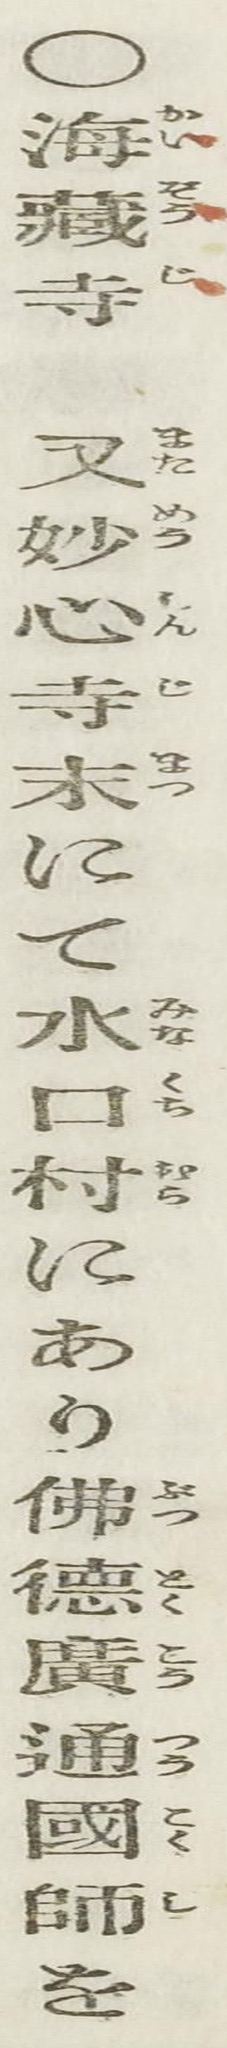○海蔵寺又妙心寺末にて水口村にあり佛徳廣通國師を
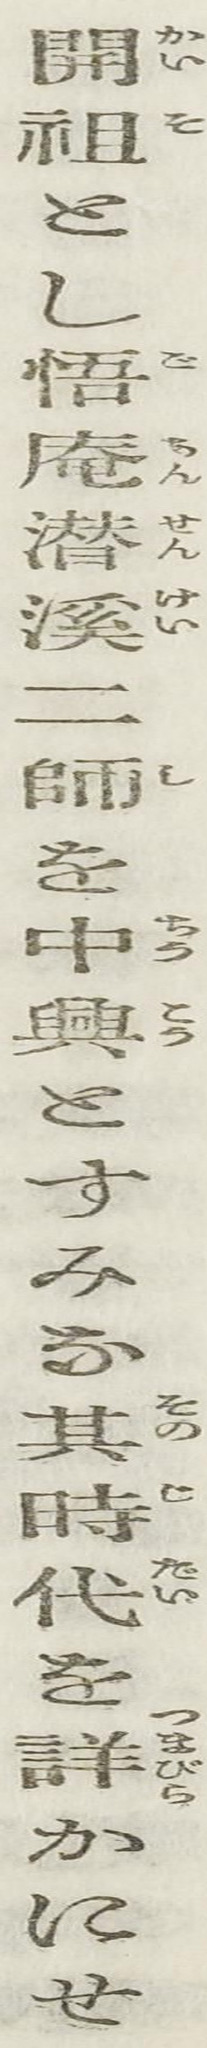開祖とし悟庵潜溪二師を中興とすみな其時代を詳かにせ
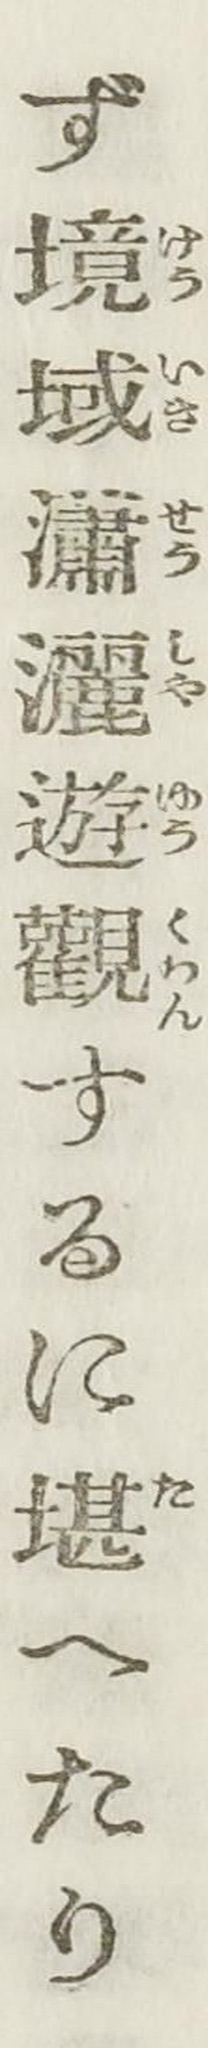ず境域潚灑遊観するに堪へたり
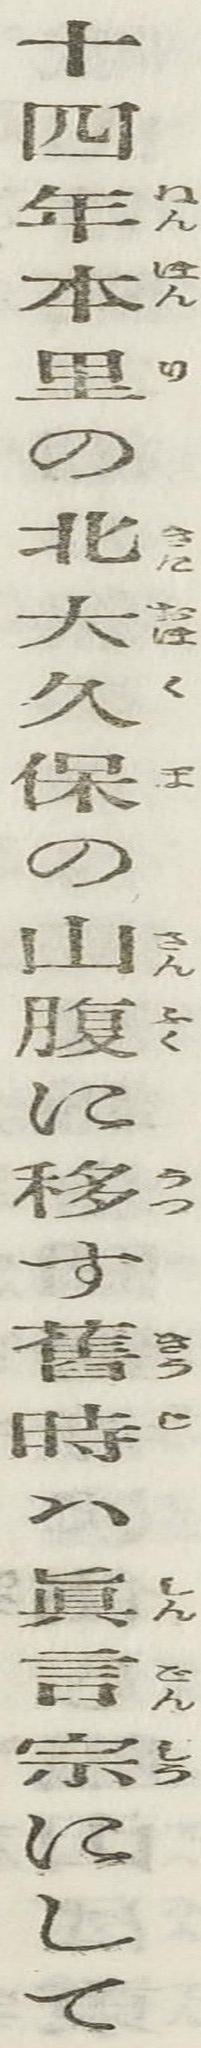十四年本里の北大久保の山腹に移す旧時は眞言宗にして
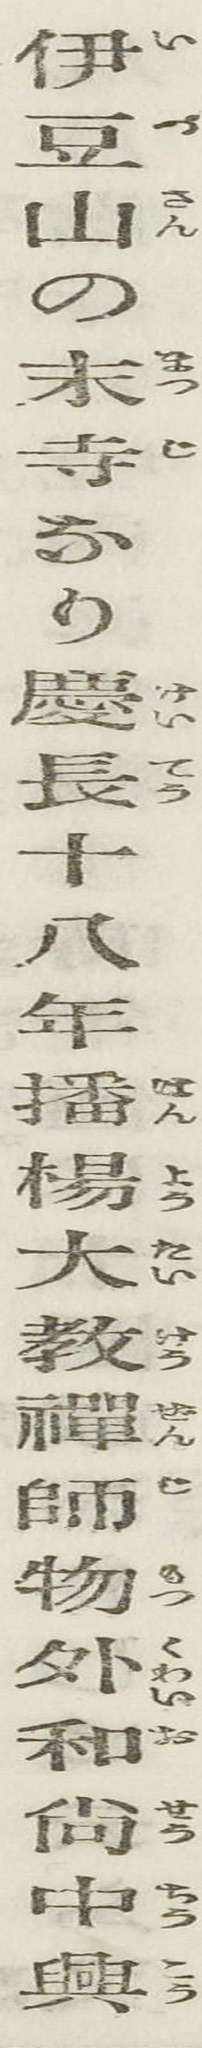伊豆山の末寺なり慶長十八年播楊大教禅師物外和尚中興

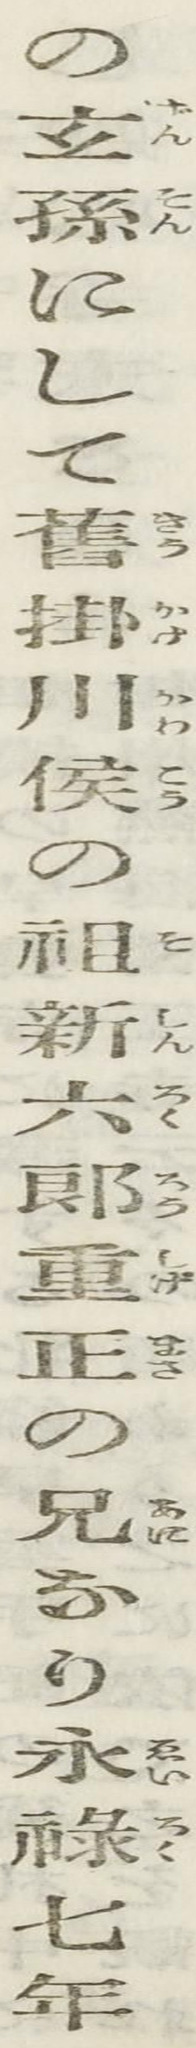の玄孫にして旧掛川侯の祖新六郎重正の兄なり永禄七年
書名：熱海獨案内　全
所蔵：東京大学地震研究所図書室 Earthquake Research Institute Library, The University of Tokyo, JAPAN
